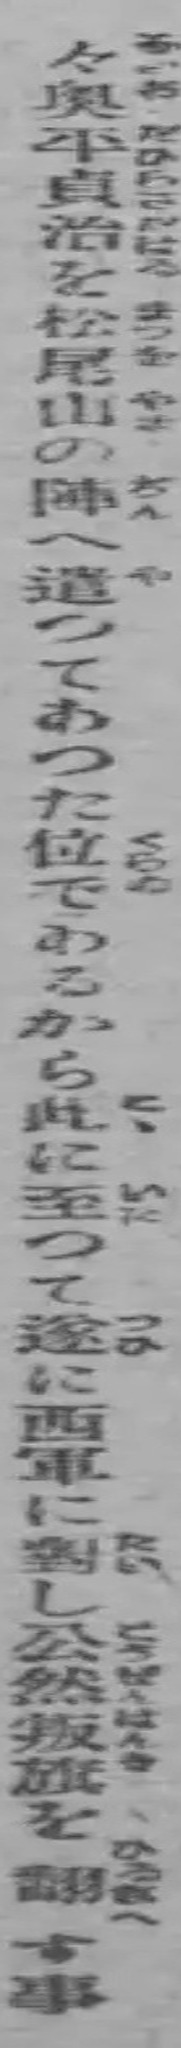内奥平貞治を松尾山の陣へ遣つてあつた位であるから此に至つて遂に西軍に対し公然叛旗を翻す事
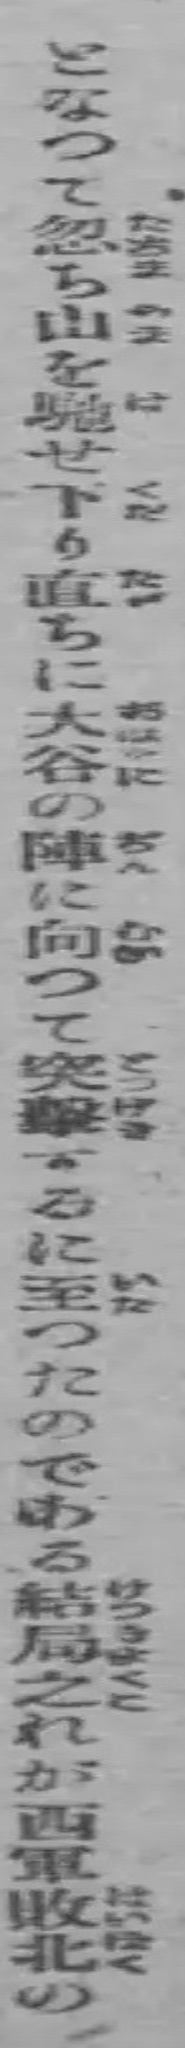となつて忽ち山を馳せ下り直ちに大谷の陣に向つて突撃するに至つたのである結局之が西軍敗北の
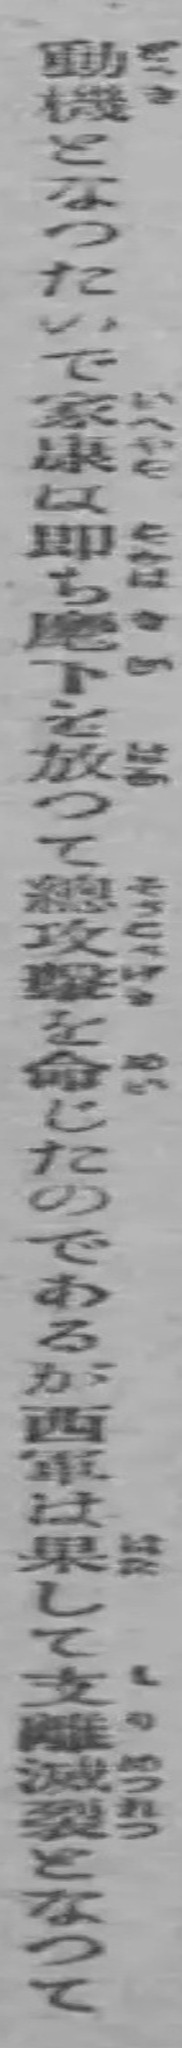動機となつたので家康は即ち麾下を放つて総攻撃を命じたのであるが西軍は果して支離滅裂となつて
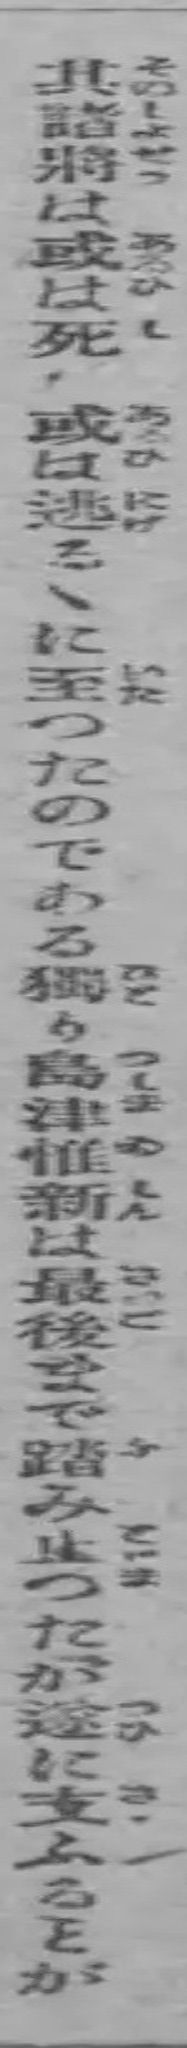其諸将は或は死に或は逃るゝに至つたのである独り島津惟新は最後まで踏み止つたが遂に支ふることが
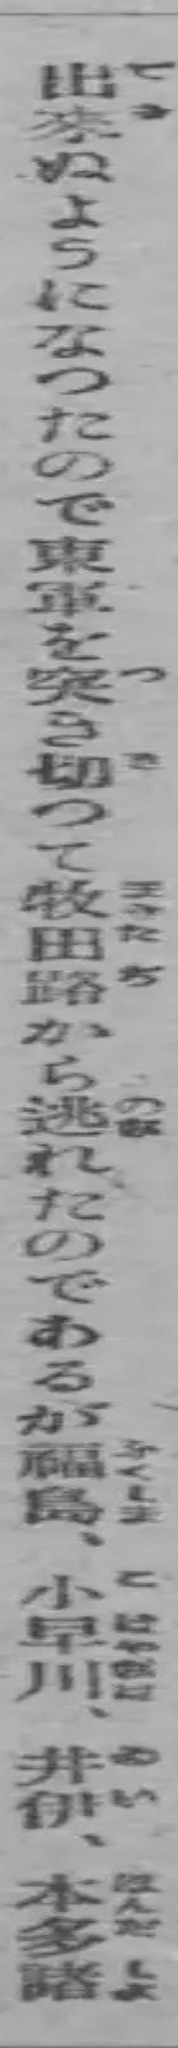出来ぬようになつたので東軍を突き切つて牧田路から逃れたのであるが福島、小早川、井伊、本多諸
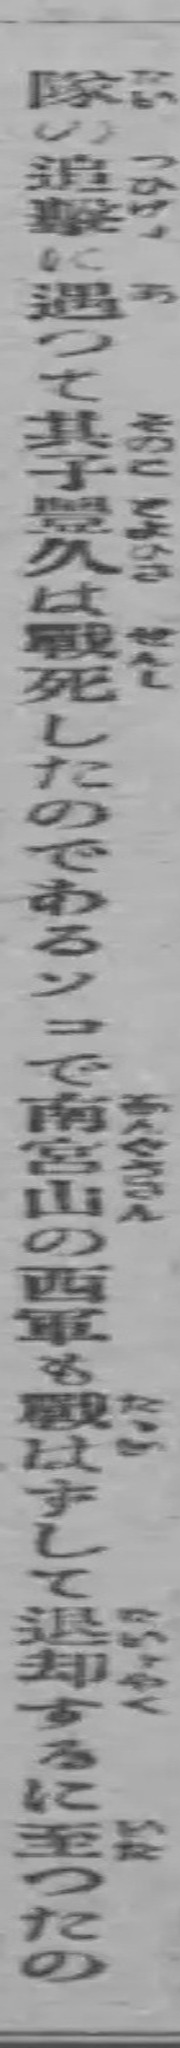隊の追撃に遭つて其子豊久は戦死したのであるソコで南宮山の西軍も戦はずして退却するに至つたの
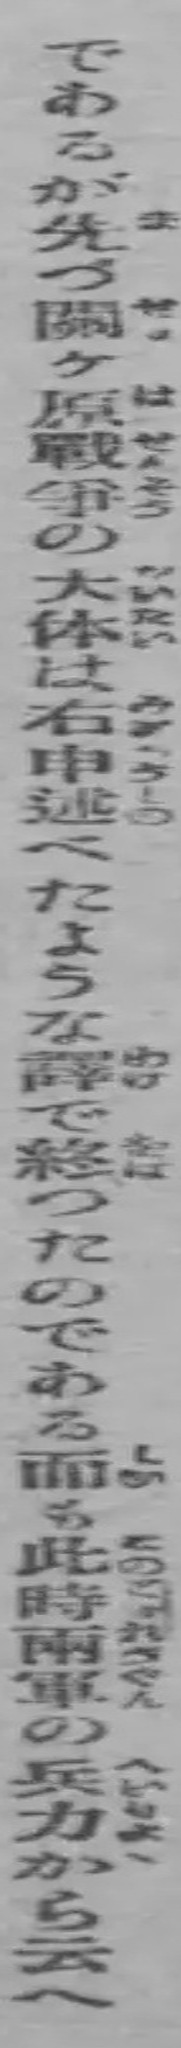であるが先づ関ヶ原戦争の大体は右申述べたような訳で終つたのである而も此時両軍の兵力から云へ
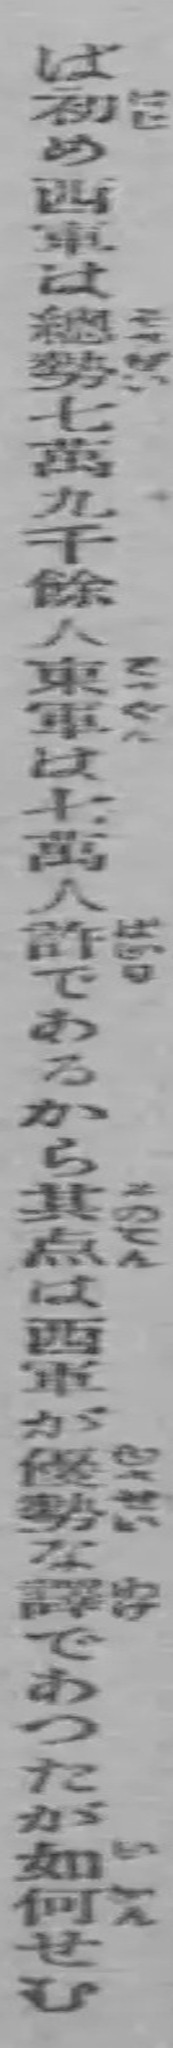ば初め西軍は総勢七万九千余人東軍七万人許であるから其点は西軍が優勢な訳であつたが如何せむ
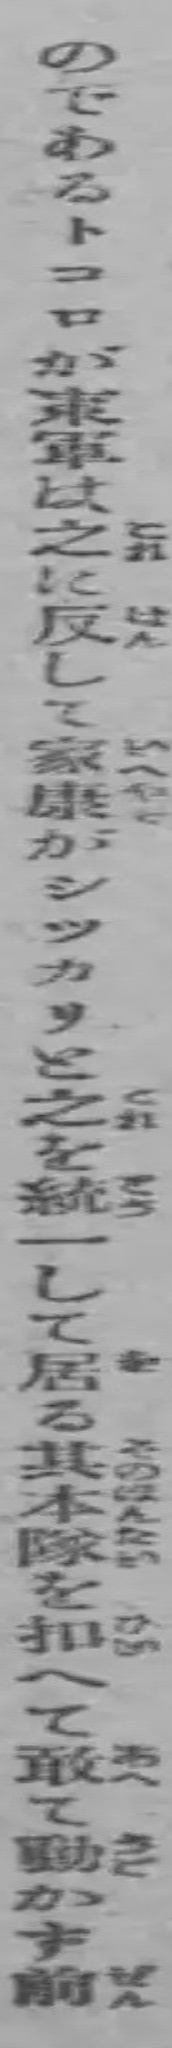のであるトコロが東軍は之に反して家康がシツカリと之を統一して居る其本隊を扣へて敢て動かず前
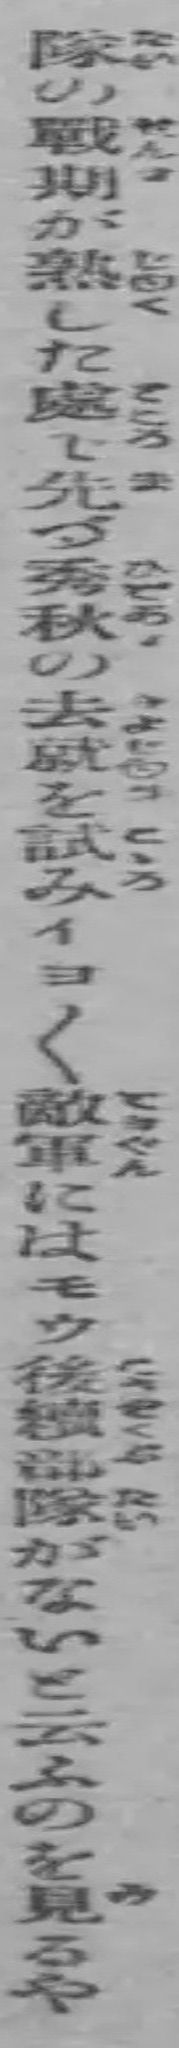隊の戦期が熟した処で先づ秀秋の去就を試みイヨ〳〵敵軍にはモウ後続部隊がないと云ふのを見るや
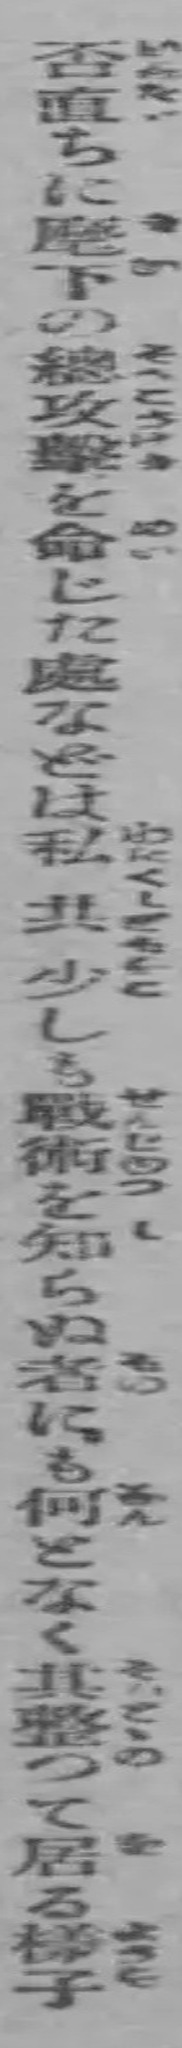否直ちに麾下の総攻撃を命じた処などは私共少しも戦術を知らぬ者にも何となく其整つて居る様子
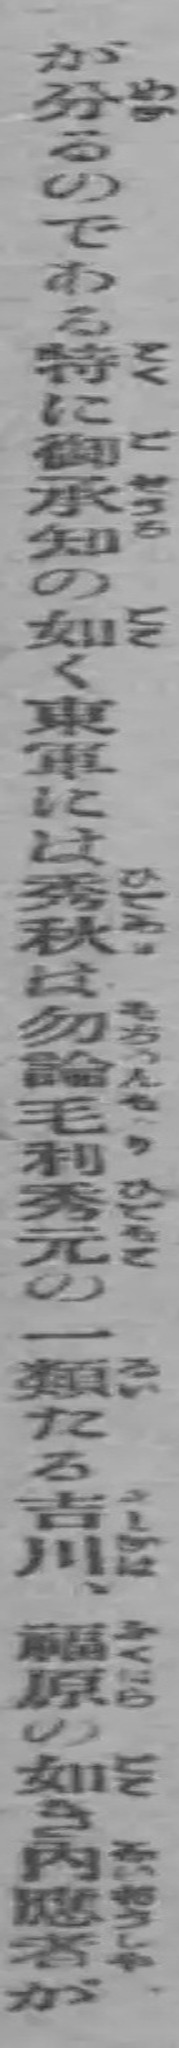が分るのである特に御承知の如く東軍には秀秋は勿論毛利秀元の一類たる吉川、福原の如き内応者が

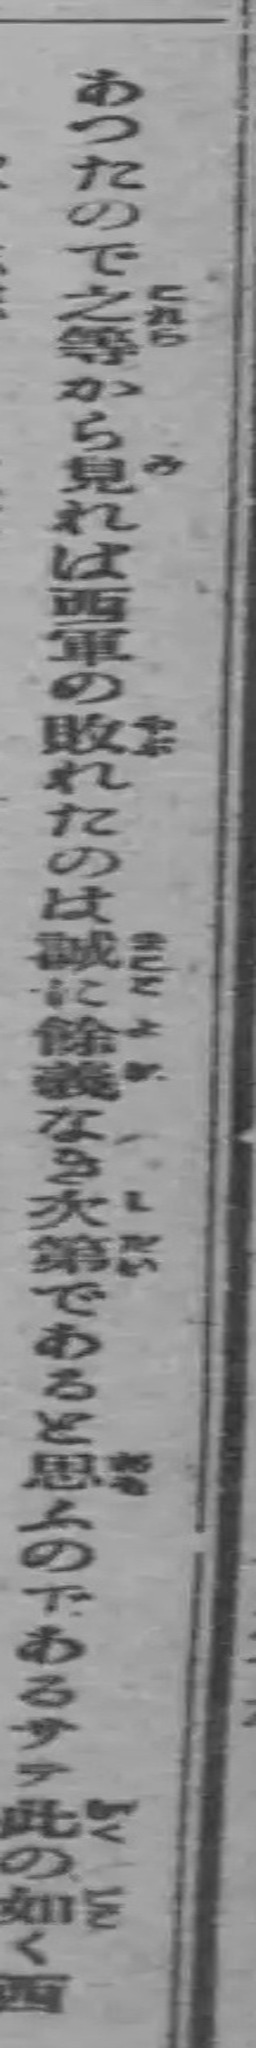あつたので之等から見れば西軍の敗れたのは誠に余義なき次第であると思ふのであるサテ此の如く西
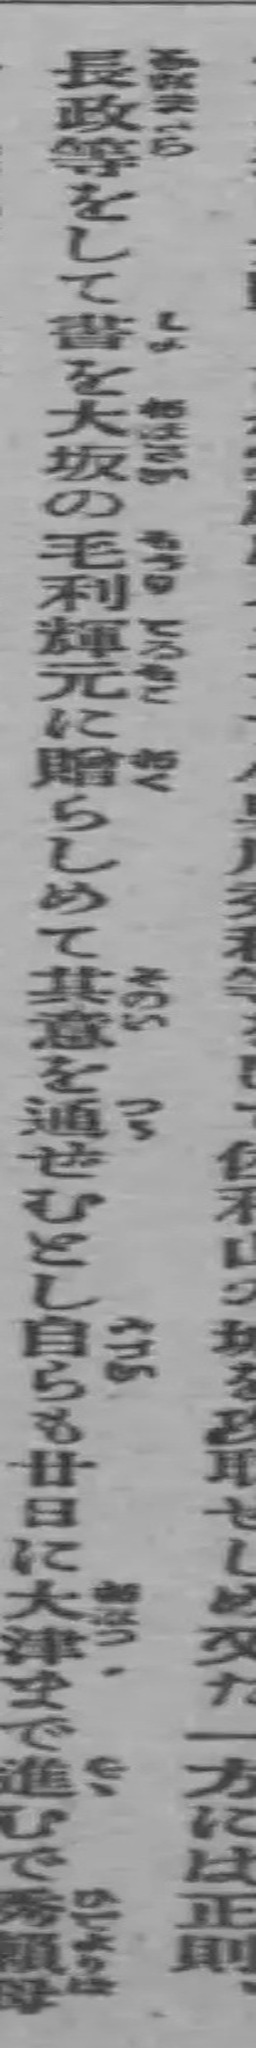長政等をして書を大坂の毛利輝元に贈らしめて其意を通せむとし自らも廿日に大津まで進むで秀頼母
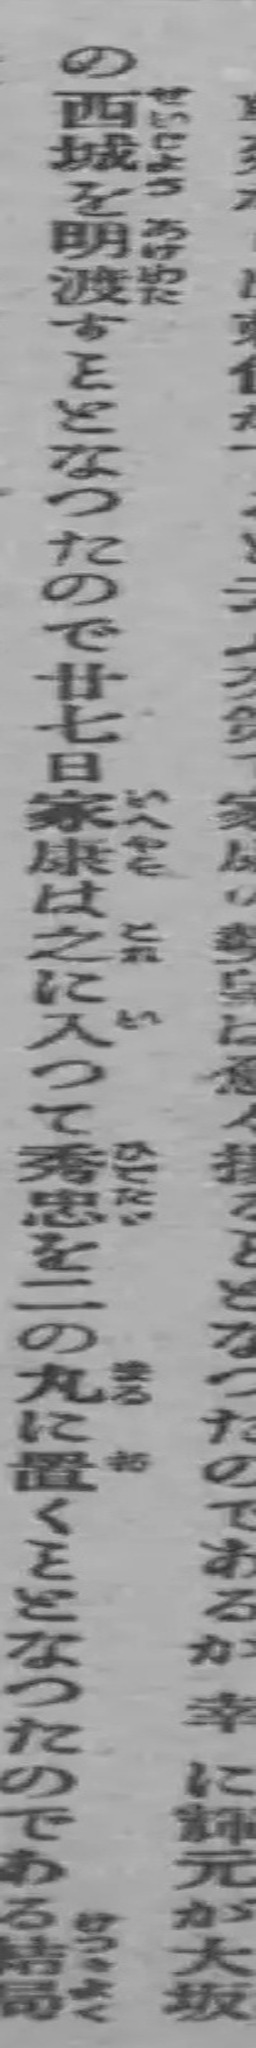の西城を明渡すこととなつたので廿七日家康は之に入つて秀忠を二の丸に置くこととなつたのである結局
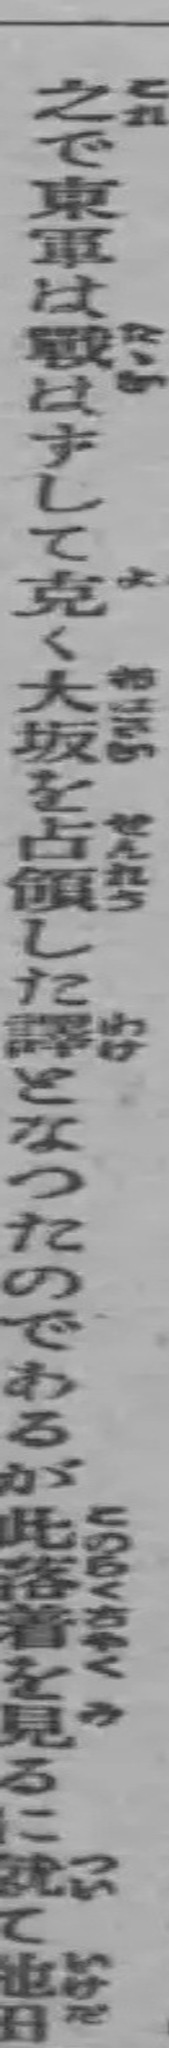之で東軍は戦はずして克く大坂を占領した訳となつたのであるが此落着を見るに就て池田輝政は正則
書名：豊橋市史談
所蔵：国立国会図書館 National Diet Library, JAPAN
